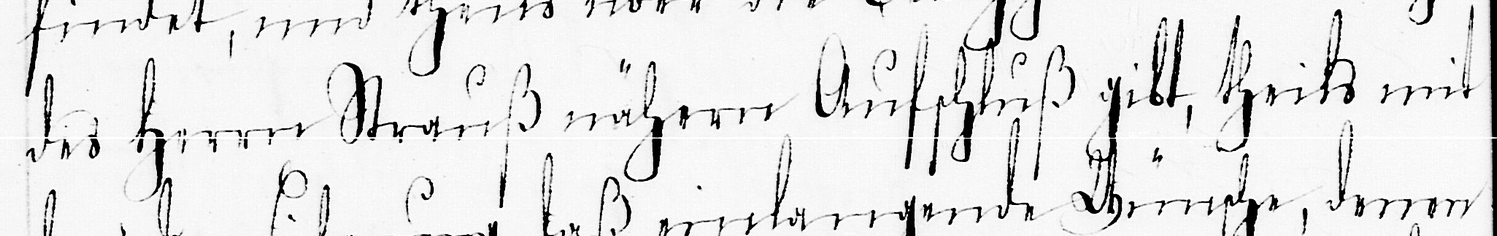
des Herrn Strauß nähern Aufschluß gibt, theils mit
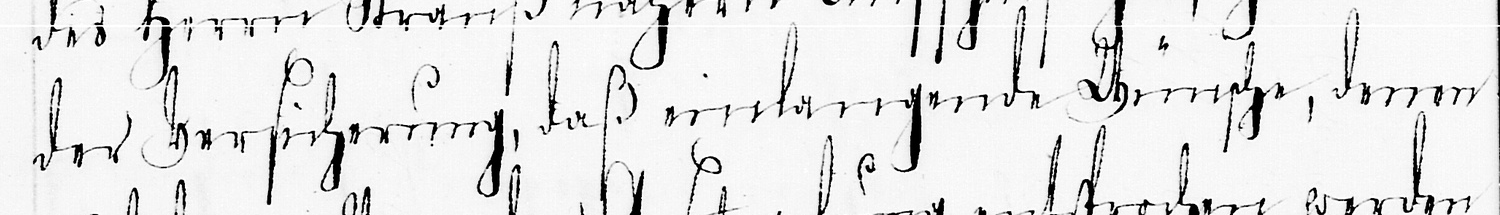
der Versicherung, daß einlangende Wünsche, denen
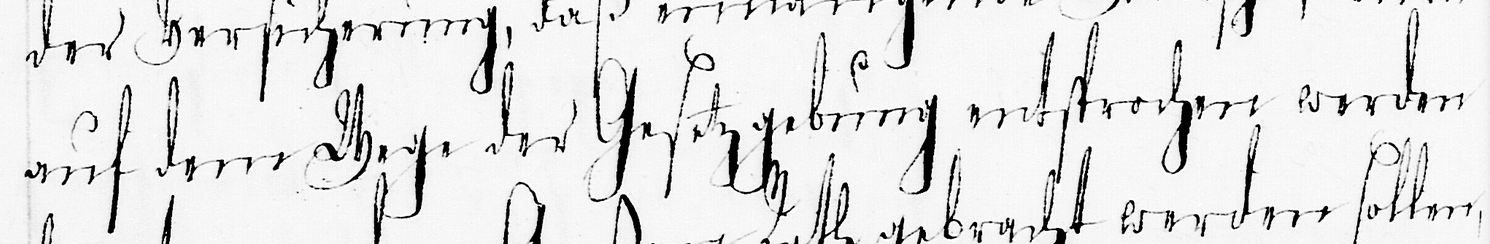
auf dem Wege der Gesetzgebung entsprochen werden
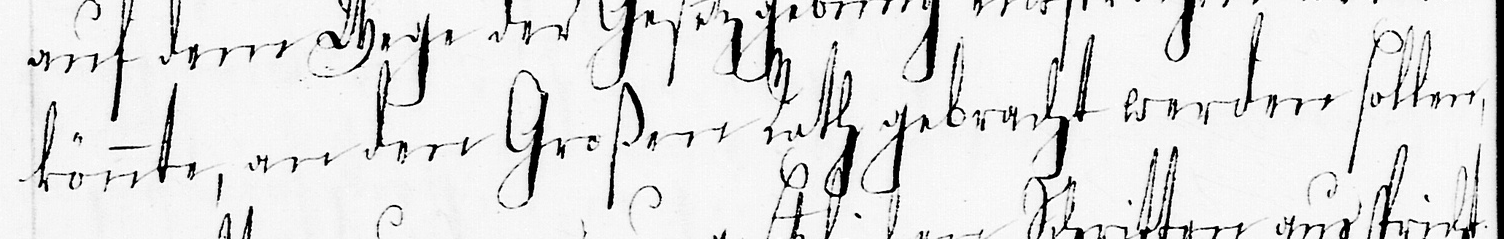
könnte, an den Großen Rath gebracht werden sollen,
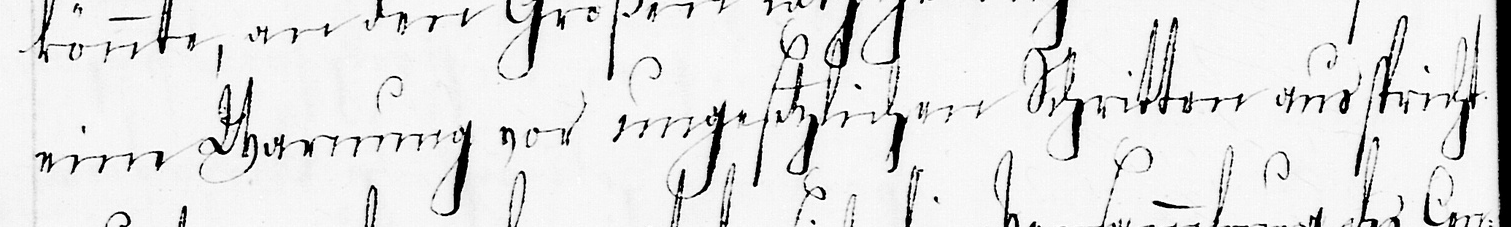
eine Warnung vor ungesetzlichen Schritten ausspricht.
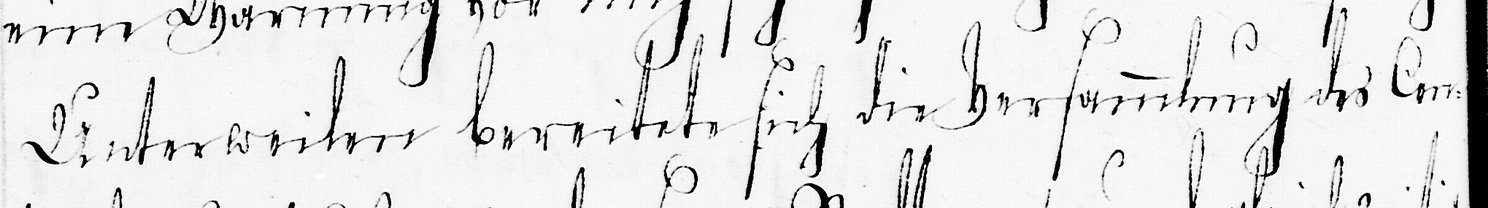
Unterweilen bereitete sich die Versammlung des Cen¬
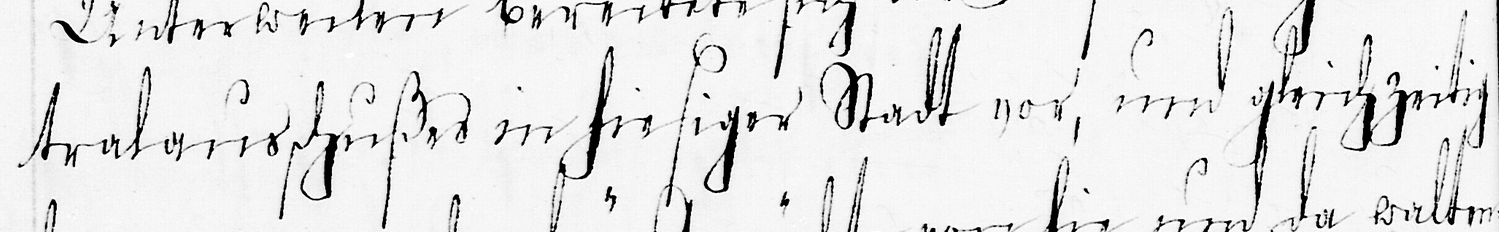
tralausschußes in hiesiger Stadt vor, und gleichzeitig
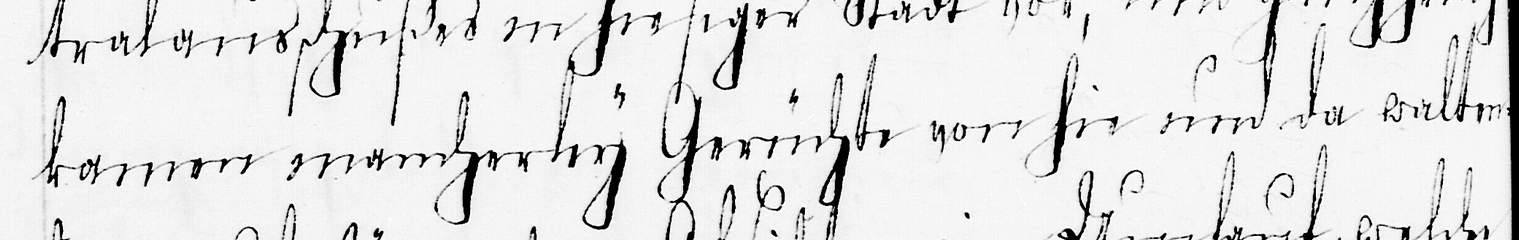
kamen mancherley Gerüchte von hie und da walten¬
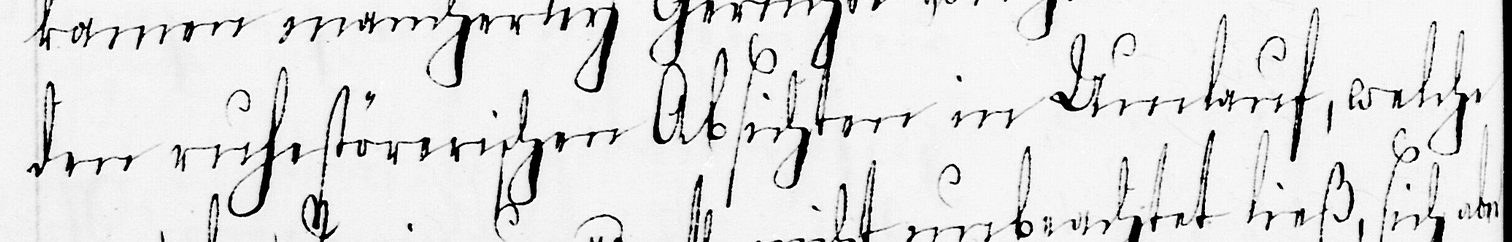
den ruhestörerischen Absichten in Umlauf, welche
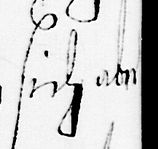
sich aber
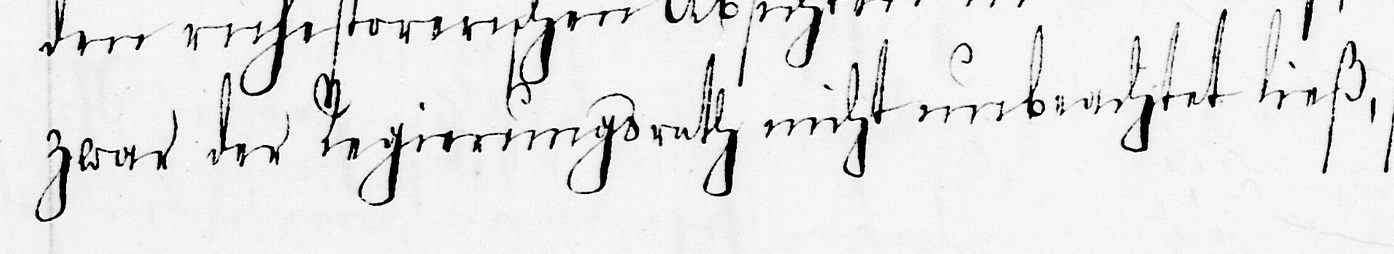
zwar der Regierungsrath nicht unbeachtet ließ,
